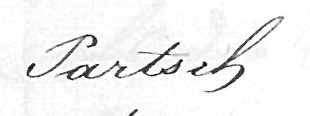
Partsch
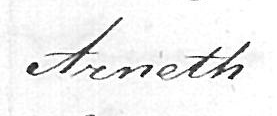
Arneth
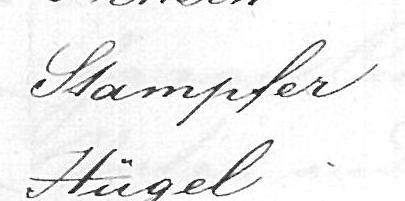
Stampfer
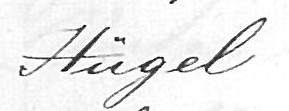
Hügel
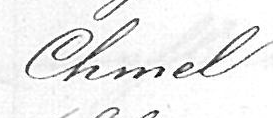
Chmel
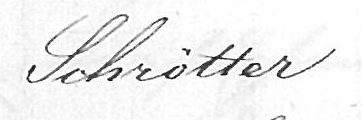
Schrötter
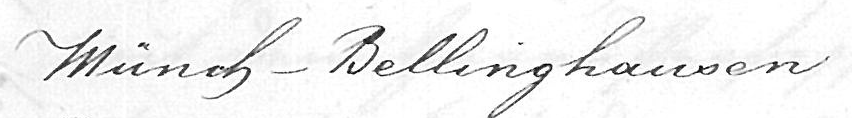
Münch-Bellinghausen
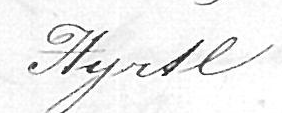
Hyrtl
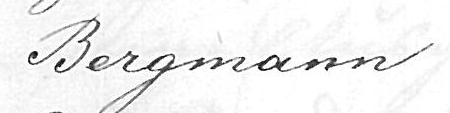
Bergmann
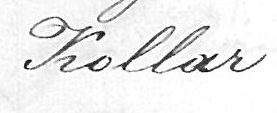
Kollar
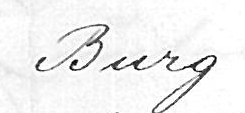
Burg
